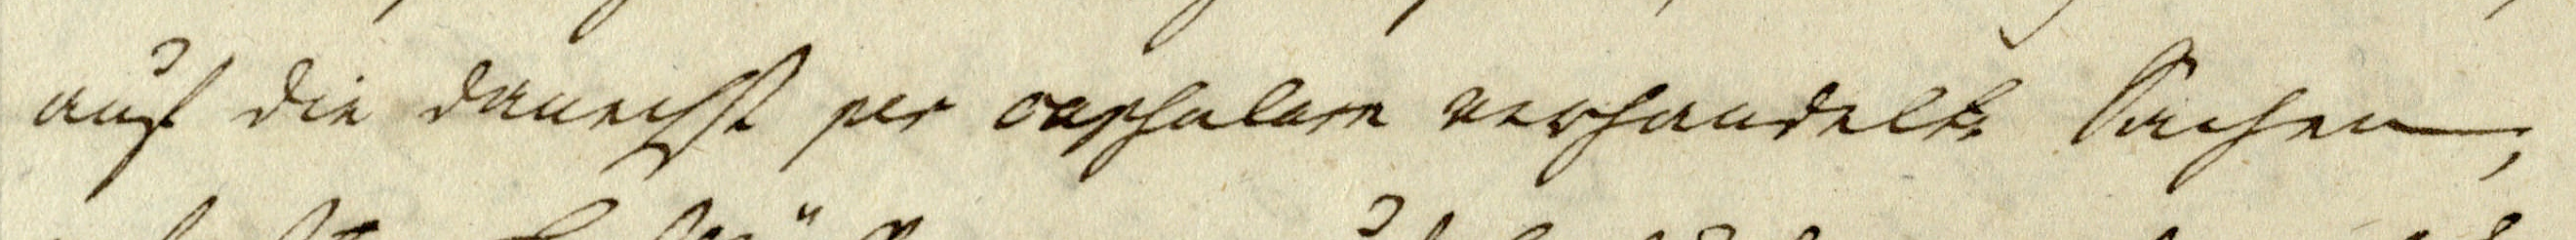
auf die danechst per capsulam verhandelte Sachen,
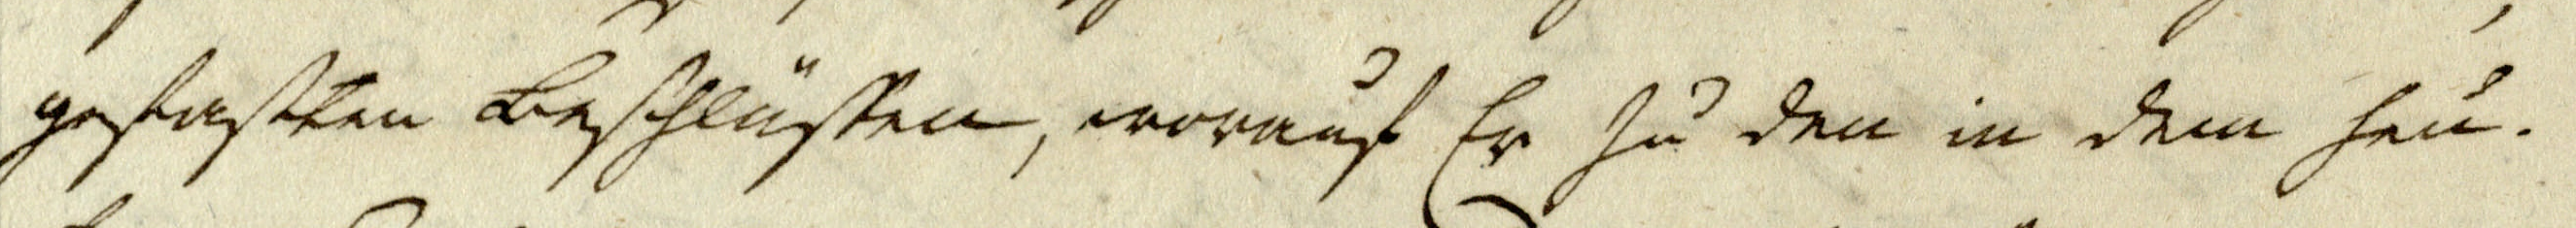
gefasten Beschlüssen, worauf Er zu den in dem heu¬
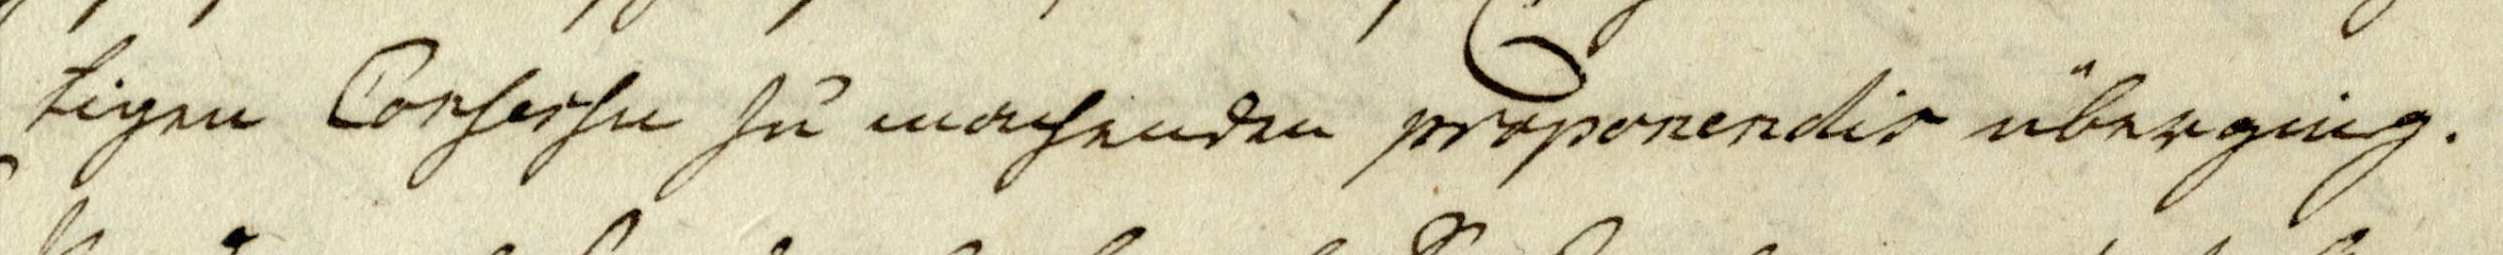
tigen Consessu zu machenden proponendis überging.
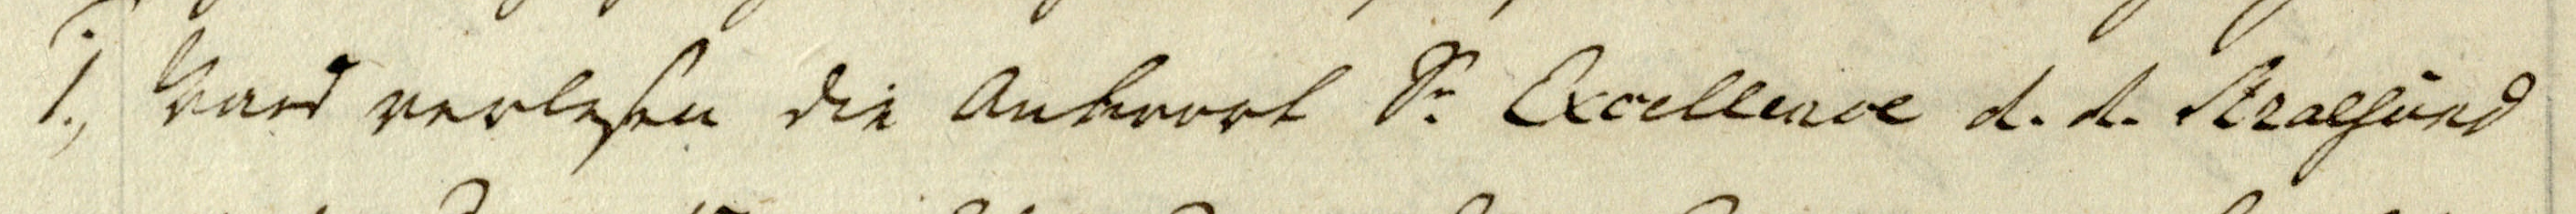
1., Ward verlesen die Antwort Sr Excellence d. d. Stralsund
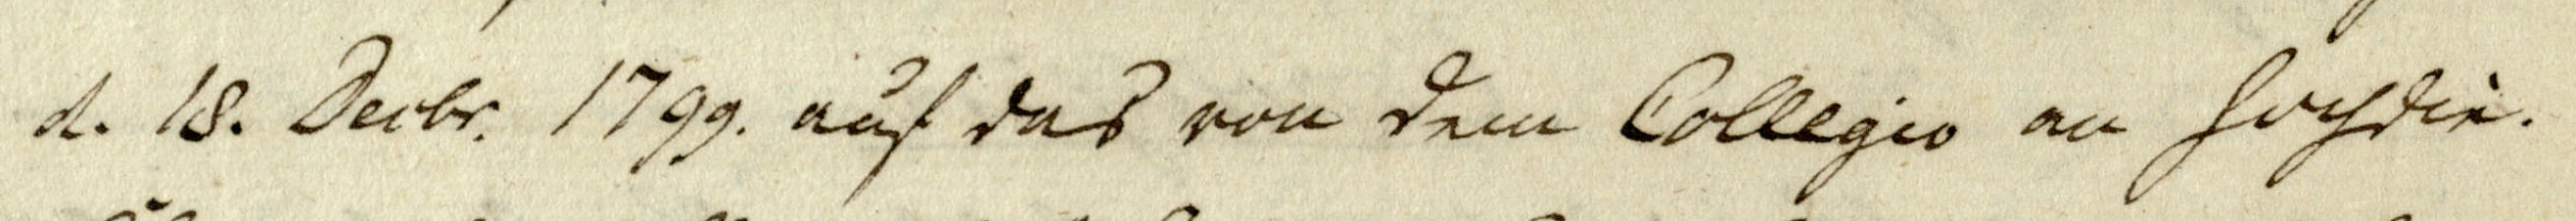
d. 18. Decbr. 1799. auf das von dem Collegio an Hochdie¬
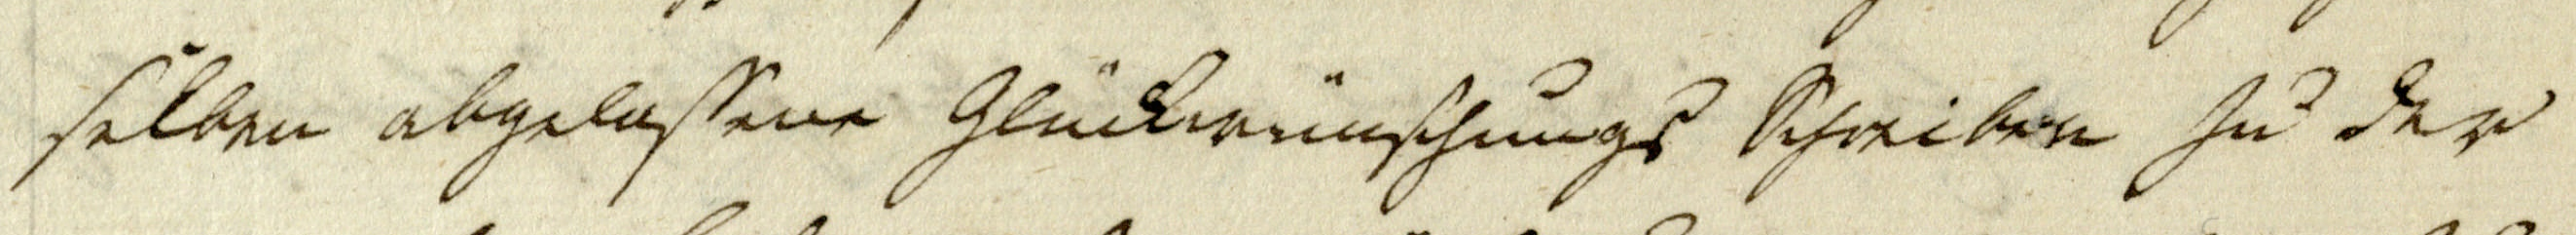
selben abgelassene Glückwünschungs Schreiben zu der
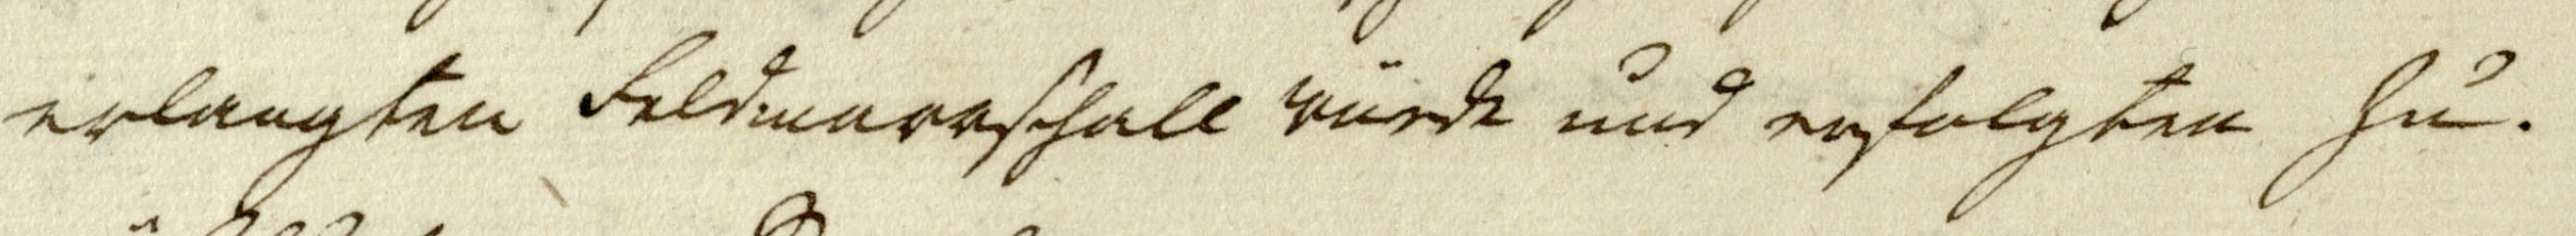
verlangten Feldmarrschall würde und erfolgten zu
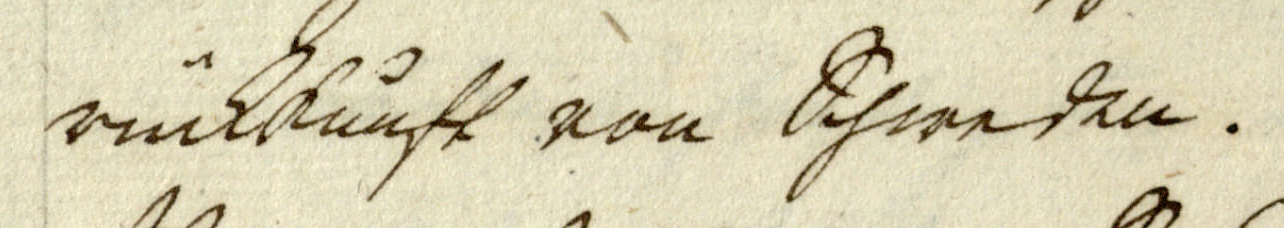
rnclkunft von Schweden.
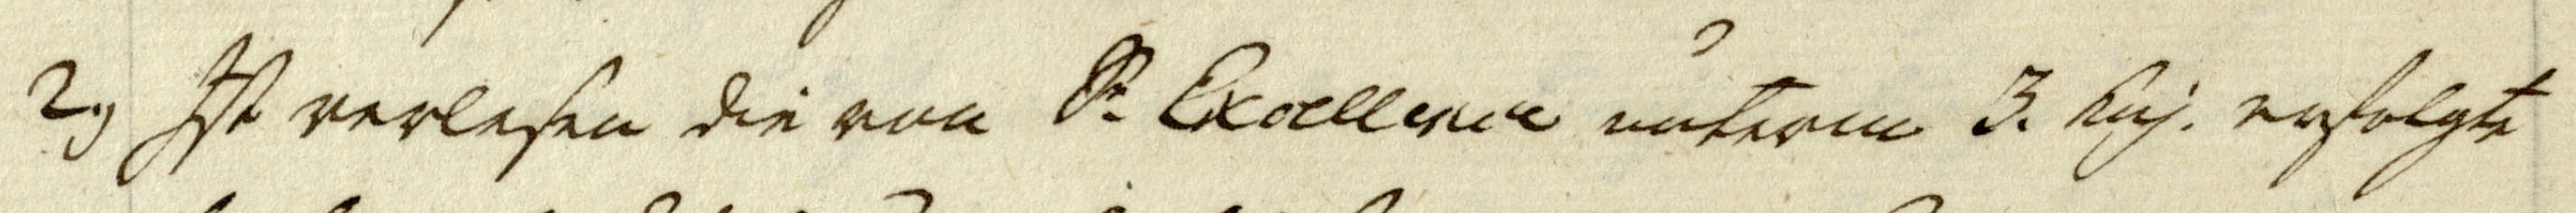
2 Ist verlesen die von Sr Excellence unterm 3. huj. erfolgt
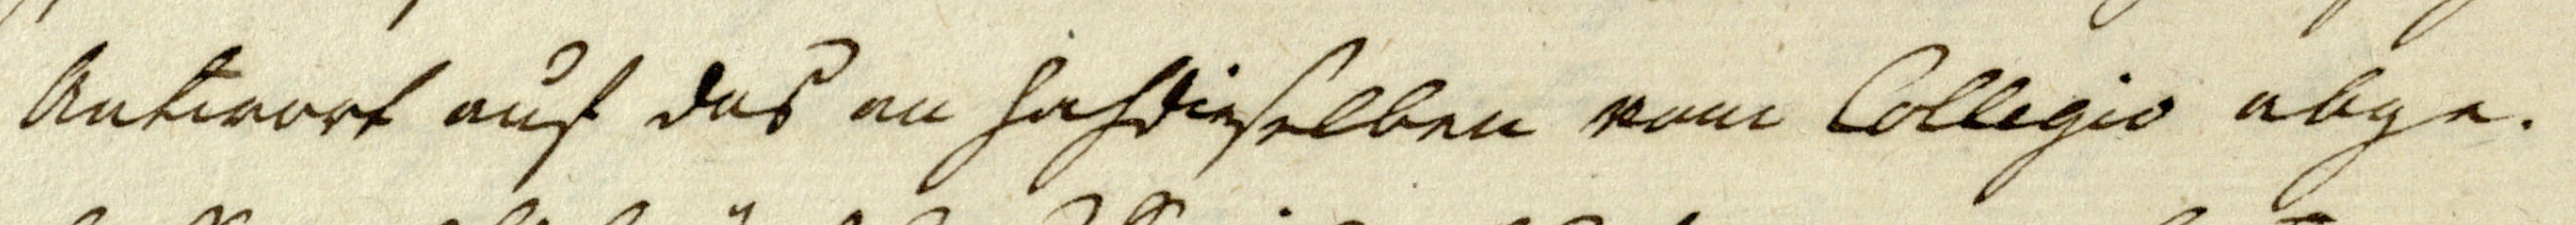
Antwort auf das an Hochdieselben vom Collegio abge¬
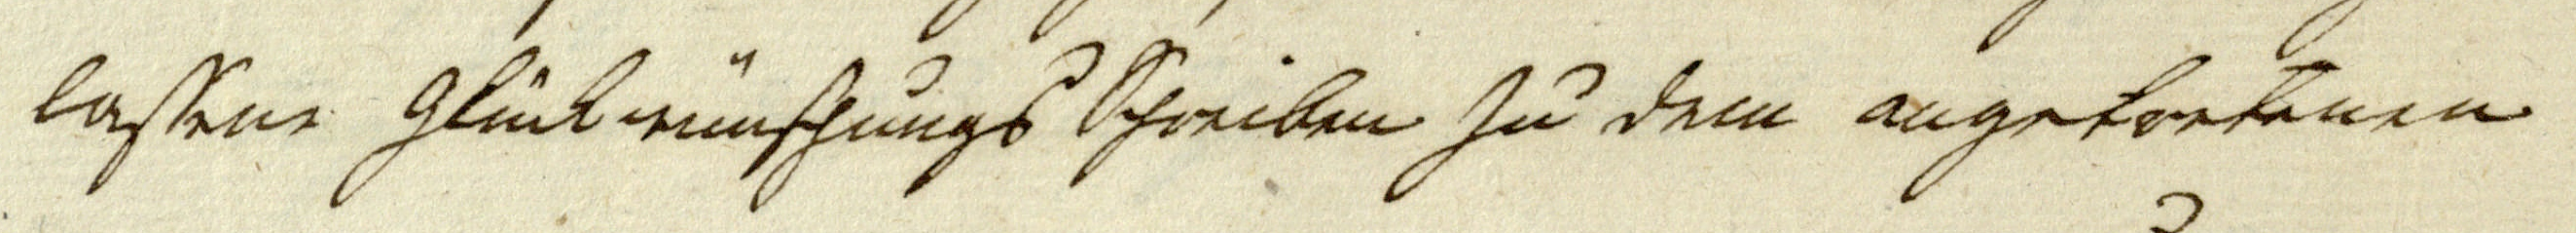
lassen Glückwünschungs Schreiben zu dem angetretenen
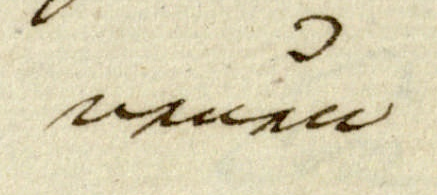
neuen
